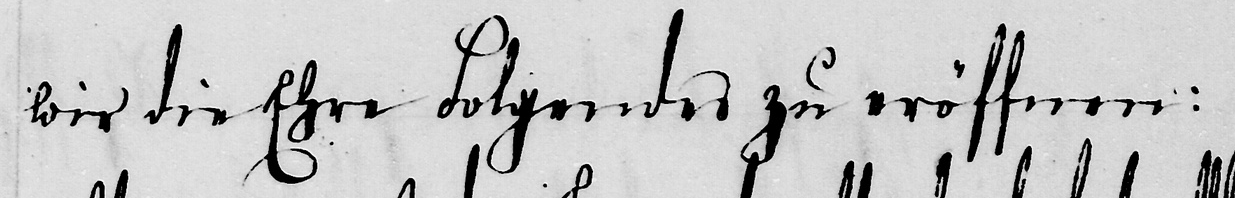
wir die Ehre Folgendes zu eröffnen:
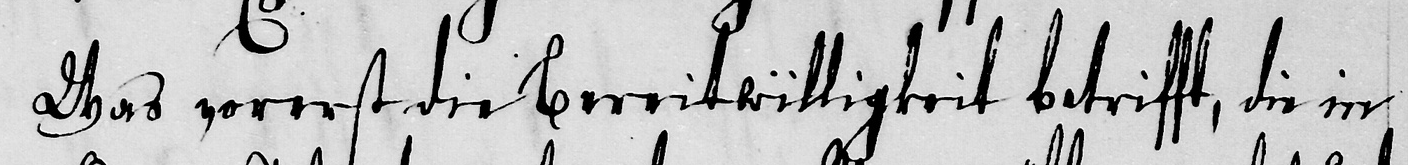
Was vorerst die Bereitwilligkeit betrifft, die in
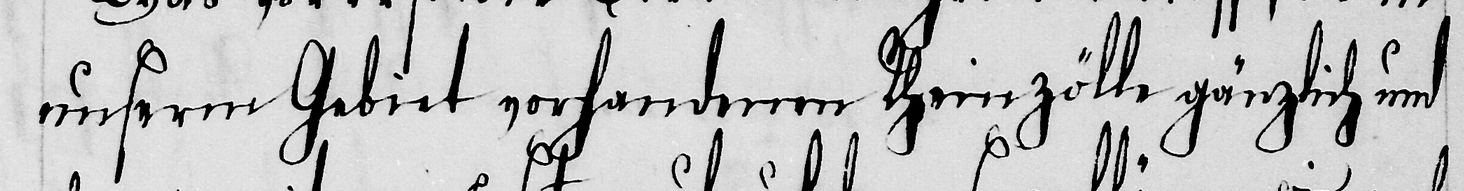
unserm Gebiet vorhandenen Rheinzölle gänzlich und
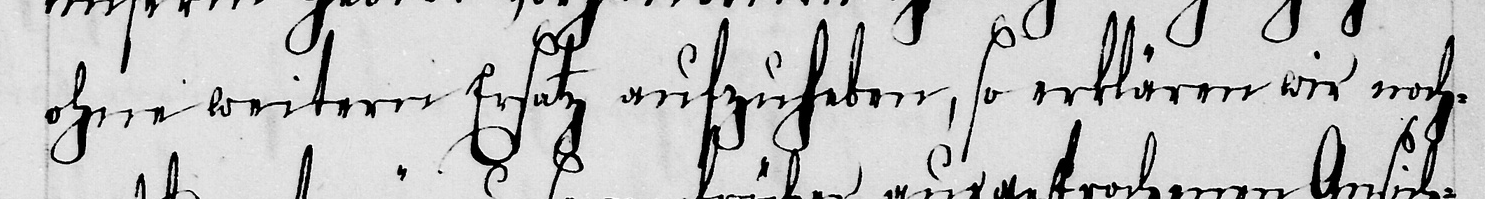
ohne weitern Ersatz aufzuheben, so erklären wir noch¬
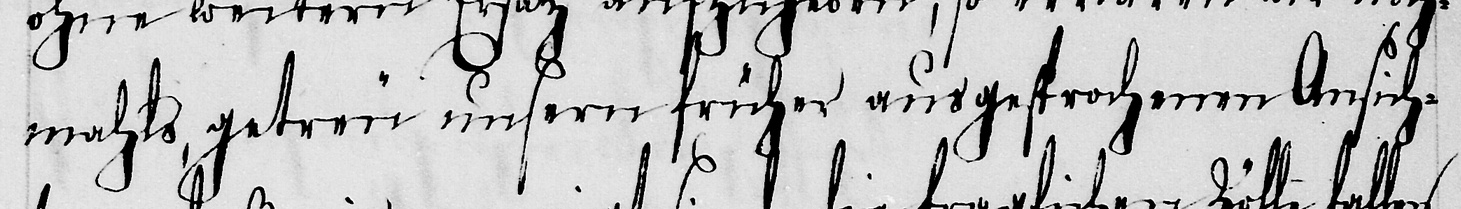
mahls, getreu unsern früher ausgesprochenen Ansich¬
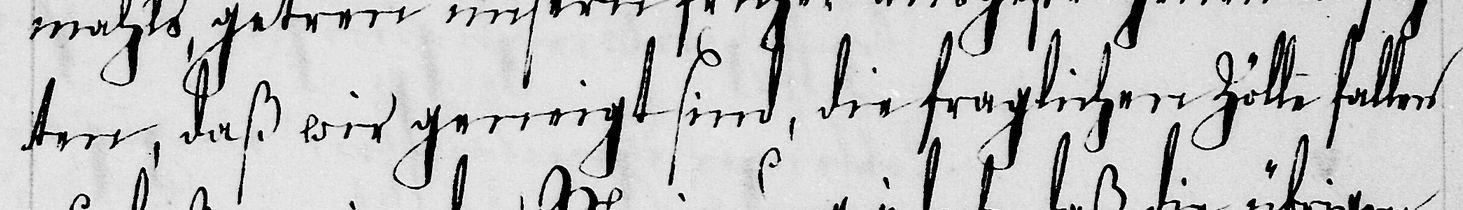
ten, daß wir geneigt sind, die fraglichen Zölle fallen
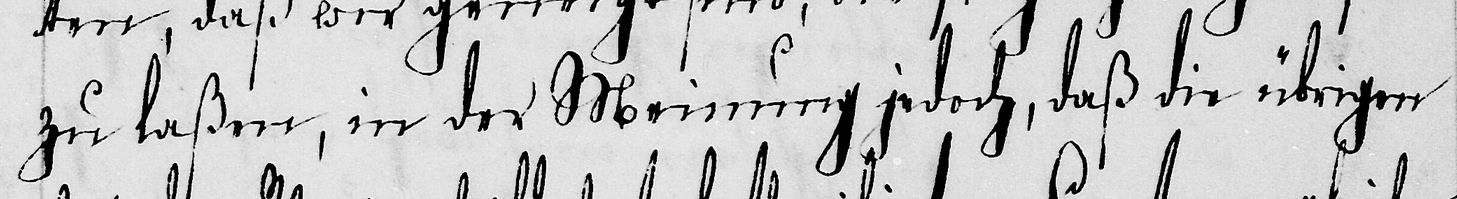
zu laßen, in der Meinung jedoch, daß die übrigen
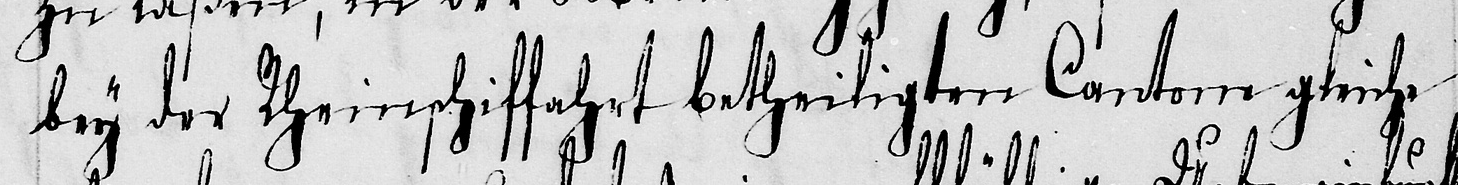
bey der Rheinschiffahrt betheiligten Cantone gleiche
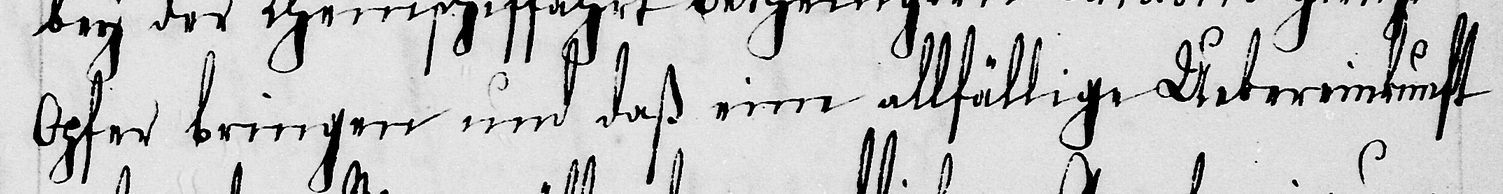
Opfer bringen und daß eine allfällige Uebereinkunft
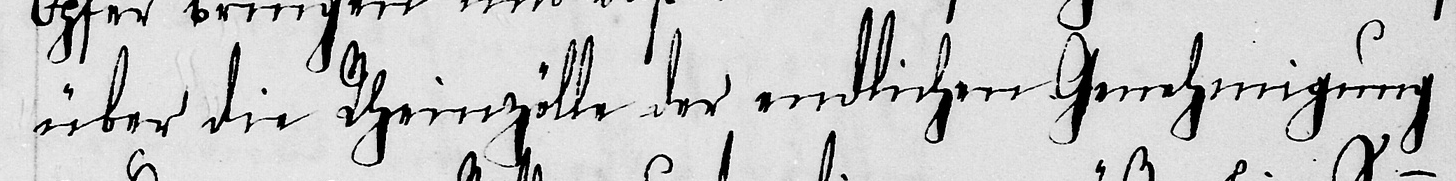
über die Rheinzölle der endlichen Genehmigung
